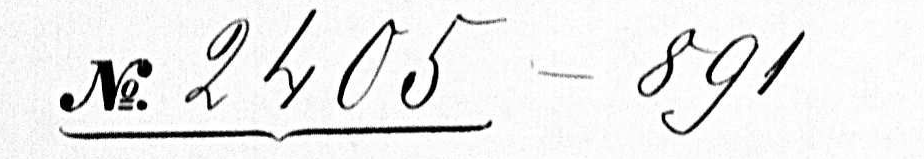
No 2405– 1891
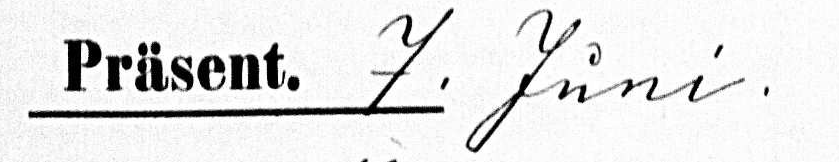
Präsent. – 7. Juni
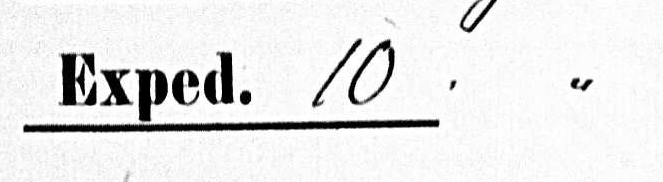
Exped. – 10. „
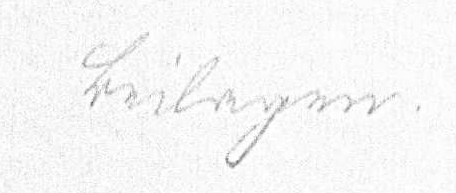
Beilagen
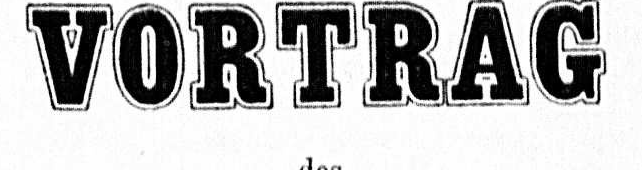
VORTRAG
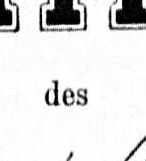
des
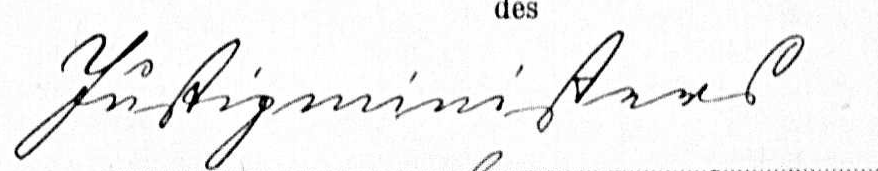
Justizministers,
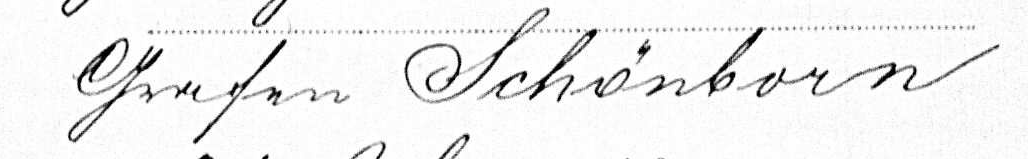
Grafen Schönborn
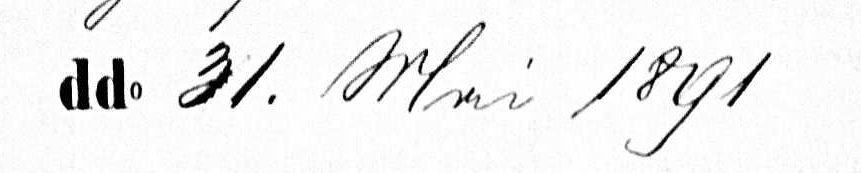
ddo 31. Mai 1891
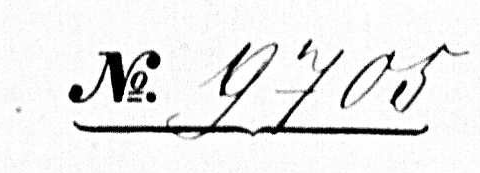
No. 9705
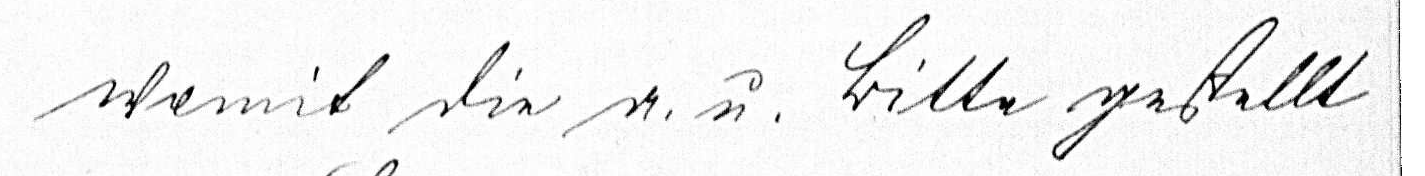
Womit die a. u. Bitte gestellt
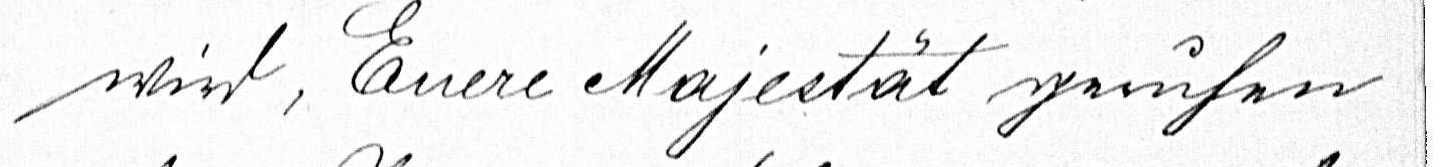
wird, Euere Majestät geruhen
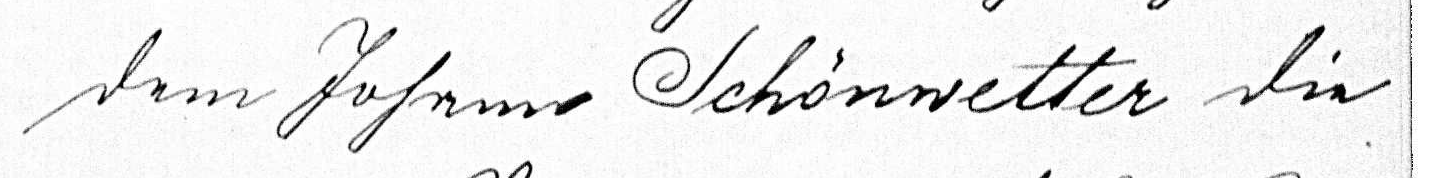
dem Johann Schönwetter die
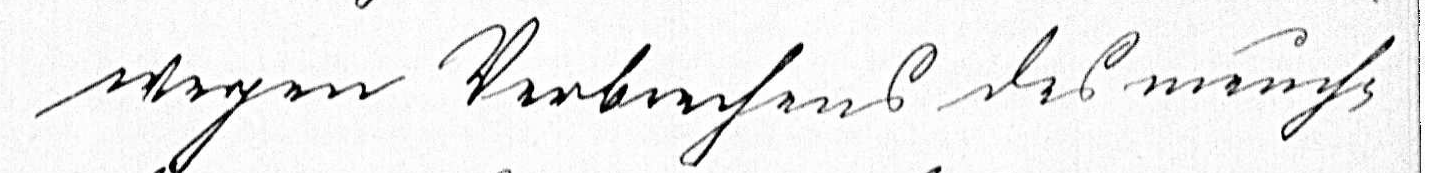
wegen Verbrechens des meuch¬
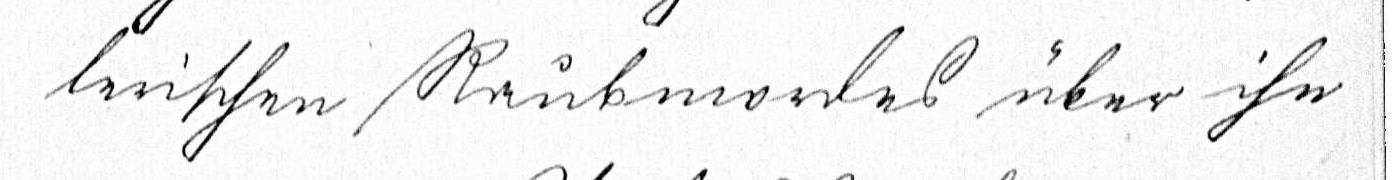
lerischen Raubmordes über ihn
